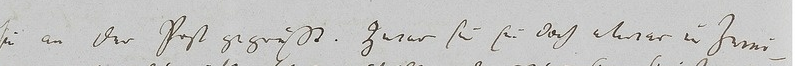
sie an der Post gegrüßt. Zwar sei sie doch etwas in Zwei-
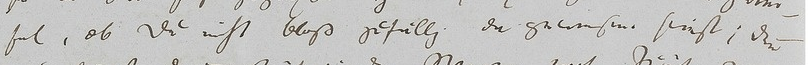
fel, ob Du nicht bloß zufällig da gewesen seiest; denn
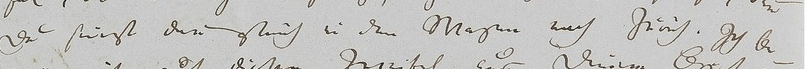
Du seiest dann gleich in den Wagen nach Zürich. Ich be-
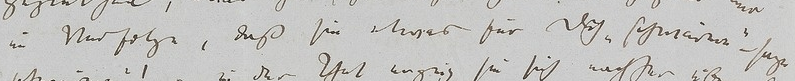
im Verfolge, daß sie etwas für Dich «schwärme» – sage
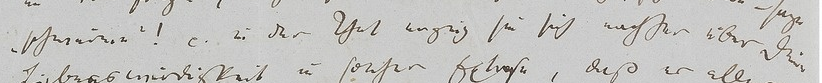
«schwärme»! &. in der That erging sie sich nachher über Deine
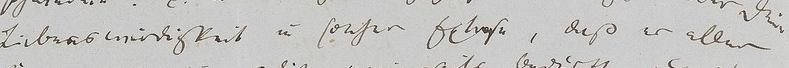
Liebenswürdigkeit in solcher Extase, daß es aller
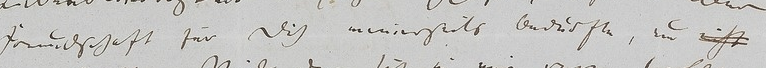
Freundschaft für Dich meinerseits bedurfte, um nicht
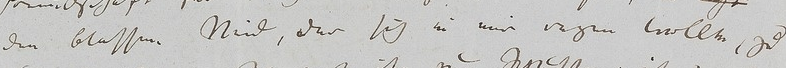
den blassen Neid, der sich in mir regen wollte, zu
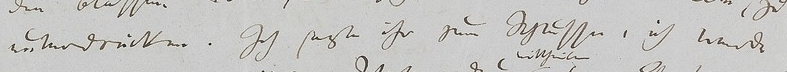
unterdrücken. Ich sagte ihr zum Schlusse, ich werde
